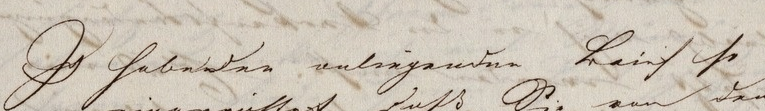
Ich habe den anliegenden Brief so
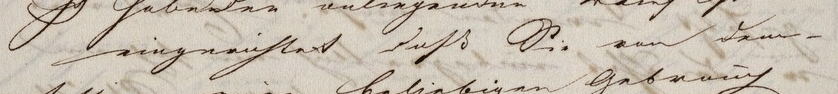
eingerichtet, daß Sie von dem-
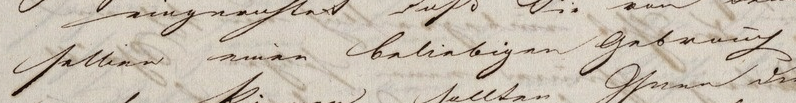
selben einen beliebigen Gebrauch
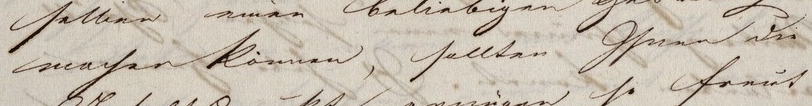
machen können, sollten Ihnen die
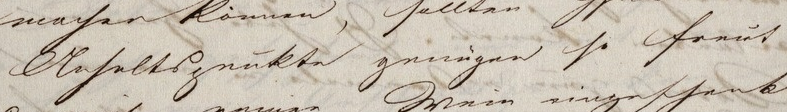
Anhaltspunkte genügen so freut
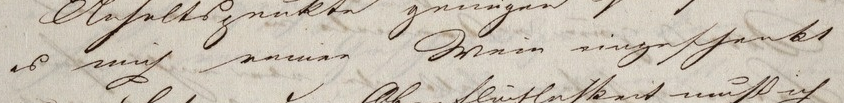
es mich reinen Wein eingeschenkt
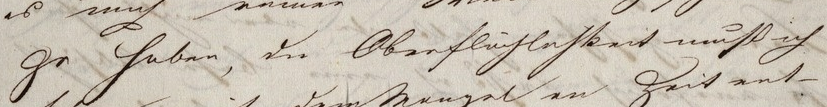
zu haben, die Oberflächlichkeit muß ich
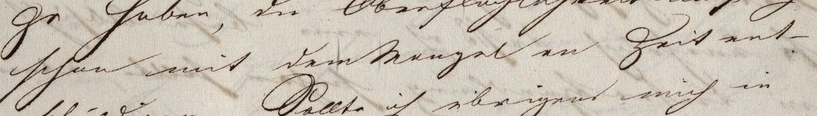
schon mit dem Mangel an Zeit ent-
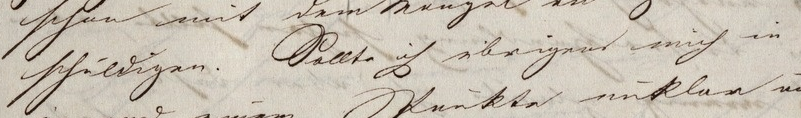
schuldigen. Sollte ich übrigens mich in
